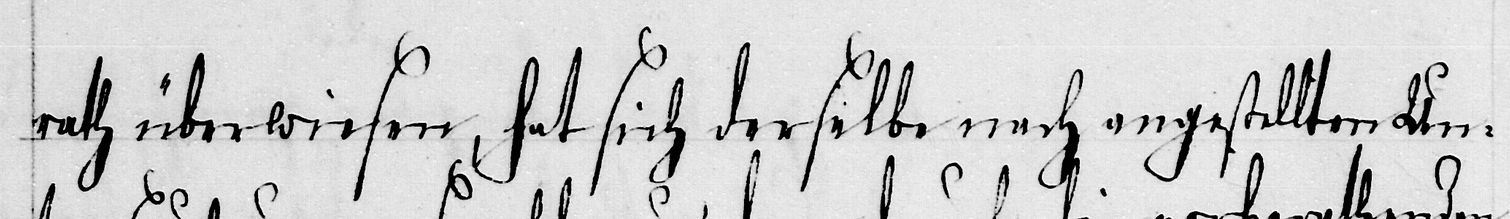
rath überwiesen, hat sich derselbe nach angestellten Un¬
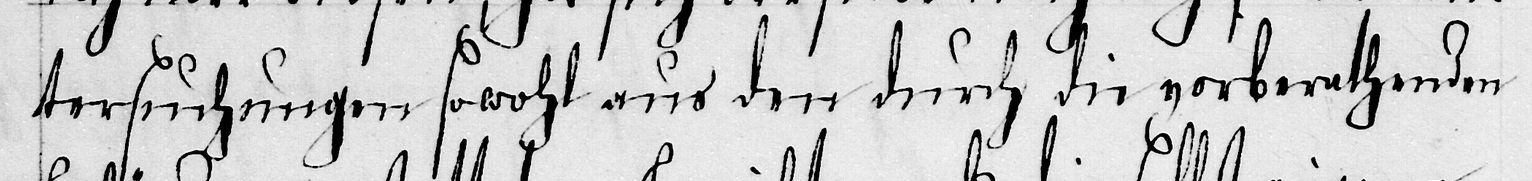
tersuchungen sowohl aus den durch die vorberathenden
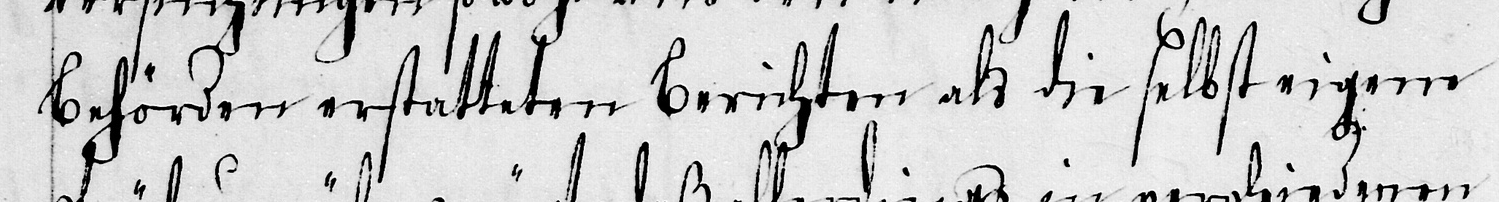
Behörden erstatteten Berichten als die selbst eigene
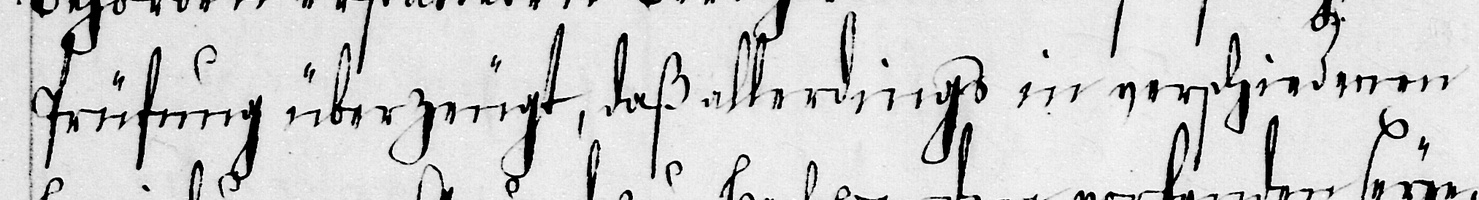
Prüfung überzeugt, daß allerdings in verschiedenen
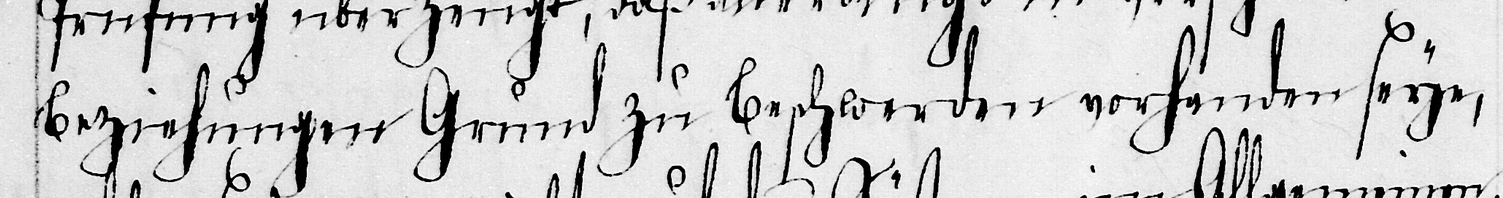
Beziehungen Grund zu Beschwerden vorhanden seye,
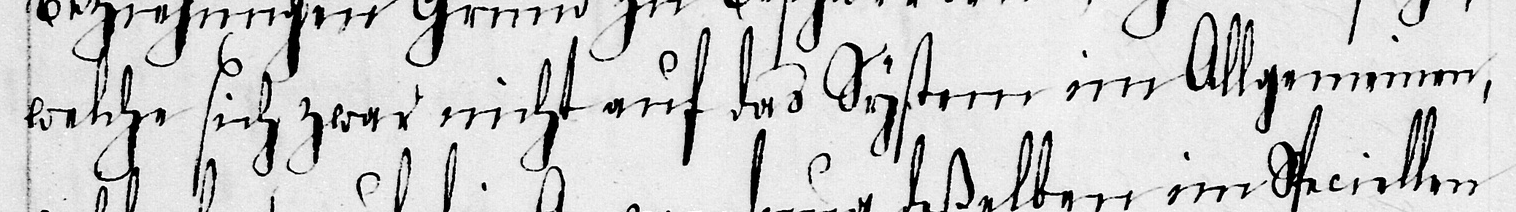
welche sich zwar nicht auf das System im Allgemeinen,
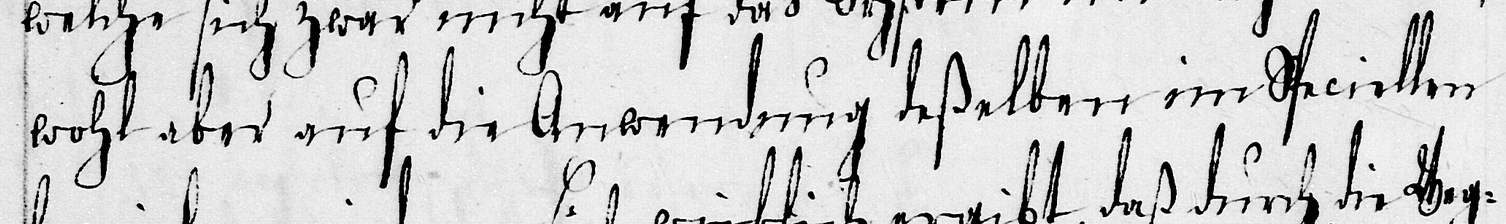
wohl aber auf die Anwendung deßelben im Speciellen
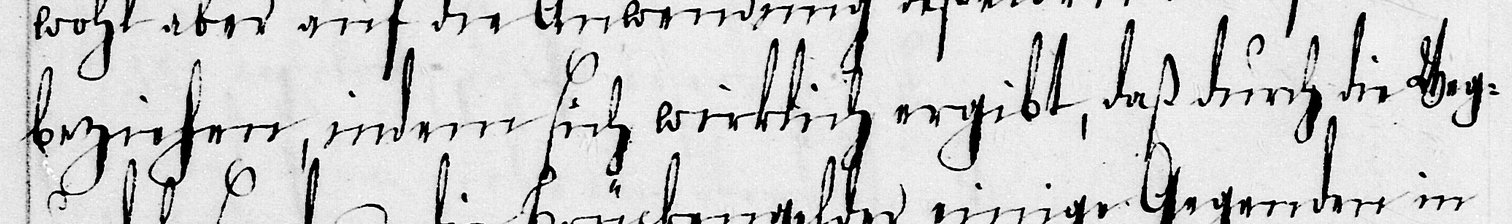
beziehen, indem sich wirklich ergibt, daß durch die Weg-
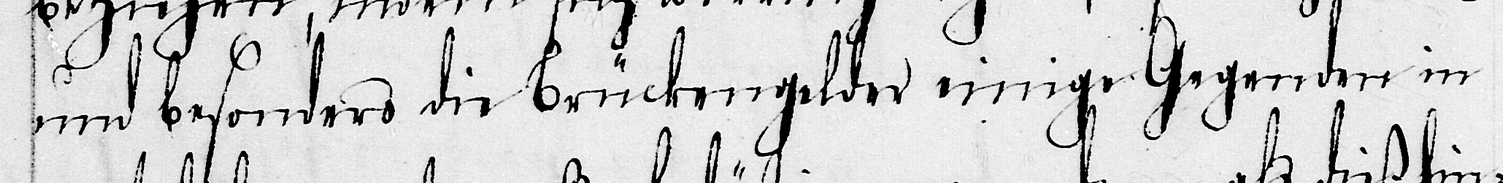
und besonders die Brückengelder einige Gegenden in
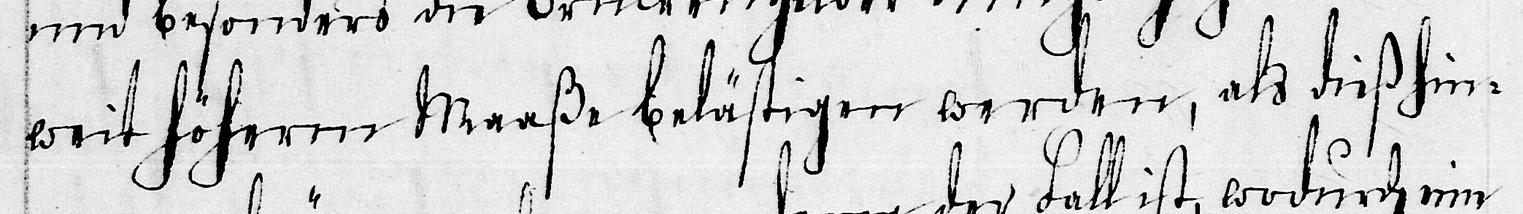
weit höherm Maaße belästigen werden, als dieß hin¬
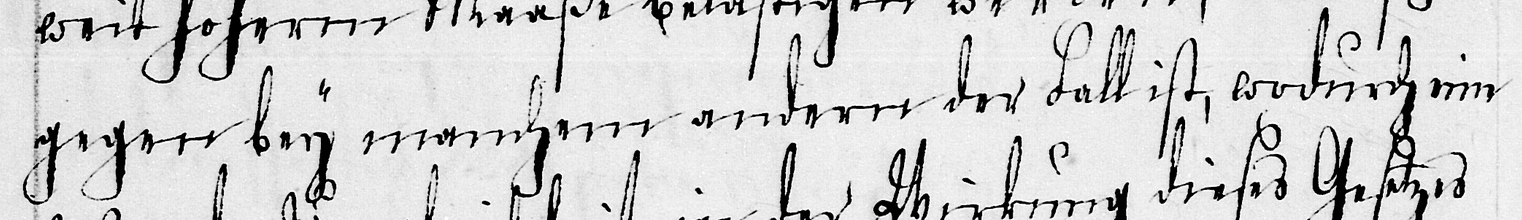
gegen bey manchem andern der Fall ist, wodurch eine
